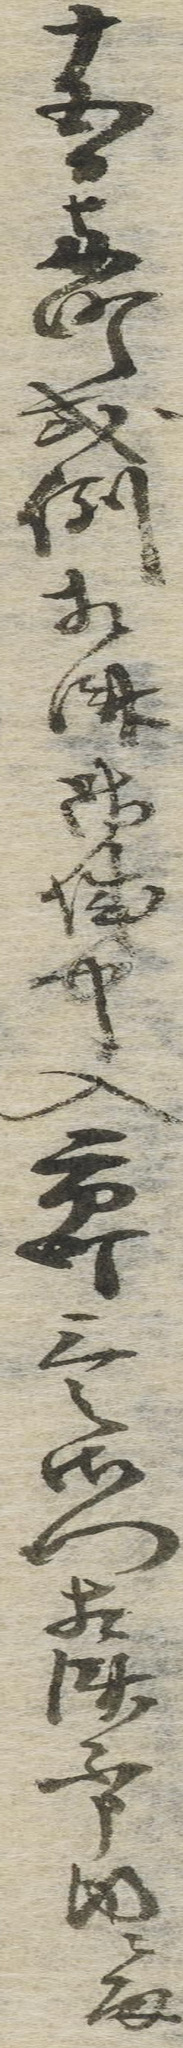十五日両町式例相済御城中二入市町三之御門相済不申内二雨
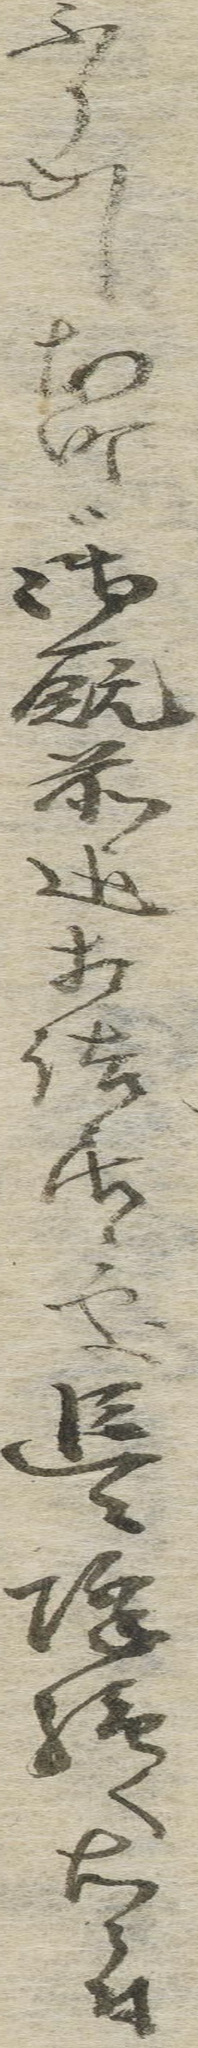ふり出し本町ハ御厩前迄相詰居候処追々降強く右二付
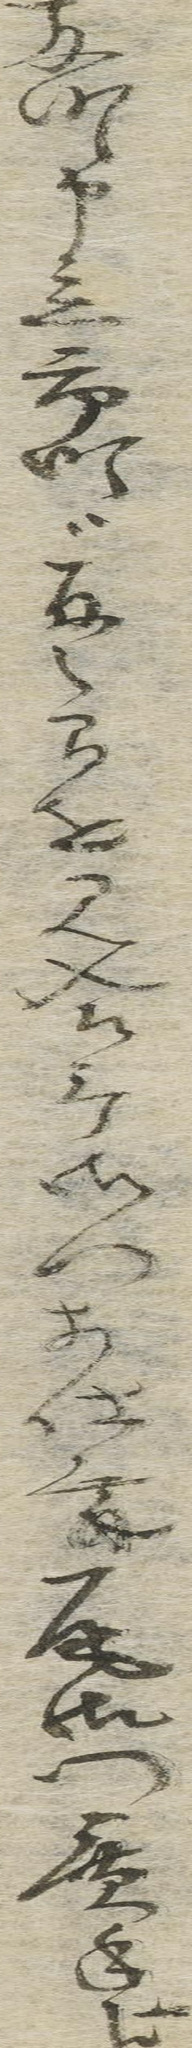両町申立市町ハ雨之間を見合三之御門相仕度瓦御門廣手江
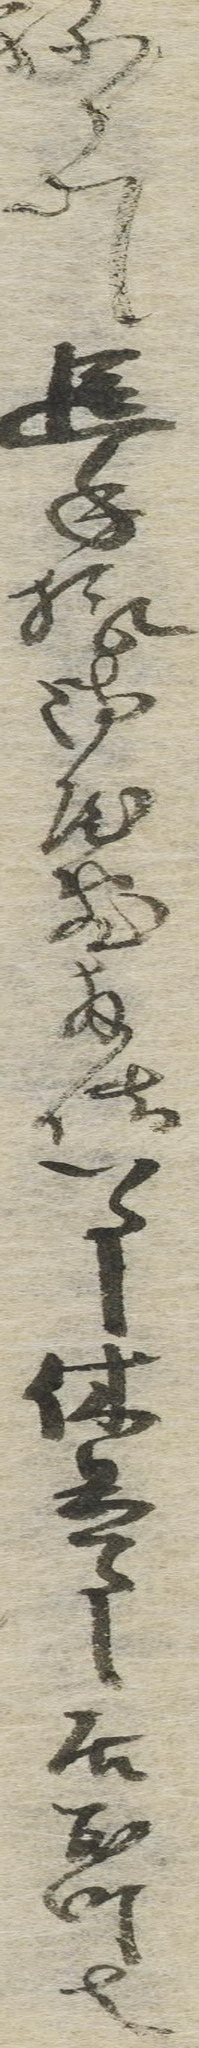練出し追手様御屋敷拝借いたし休息いたし居本町は
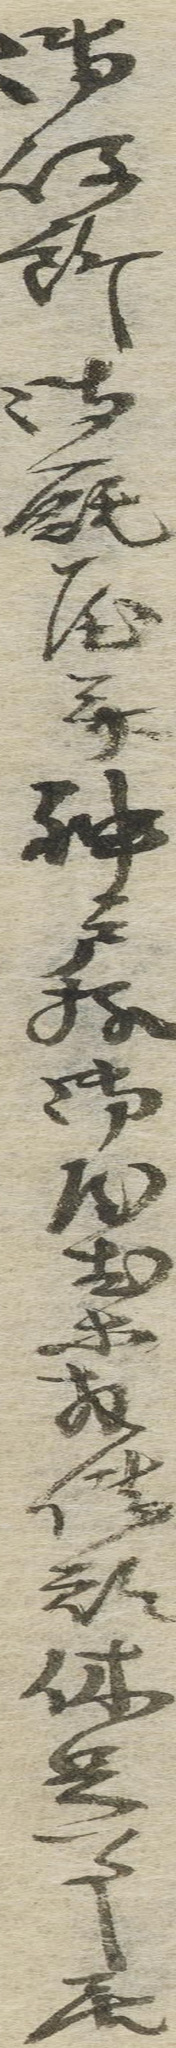御役所御厩屋并神戸様御屋敷等拝借願休息いたし居
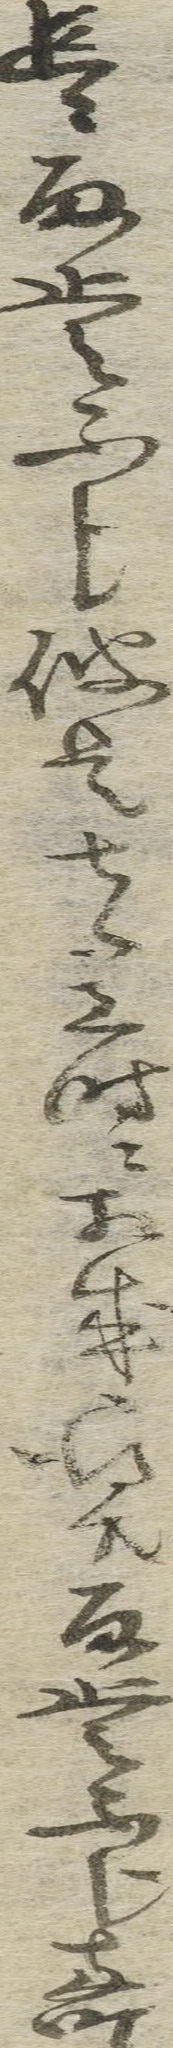追々雨止ミ不申候彼是七ッ過時二相成候得共雨止ミ不申候両町

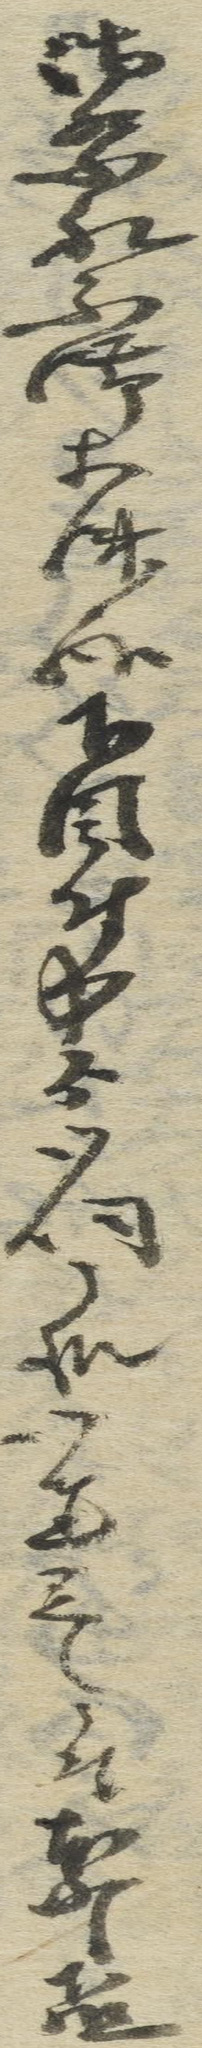御祭礼不滞相済候様下目付中ゟ御伺候様御達有之候付本町下組
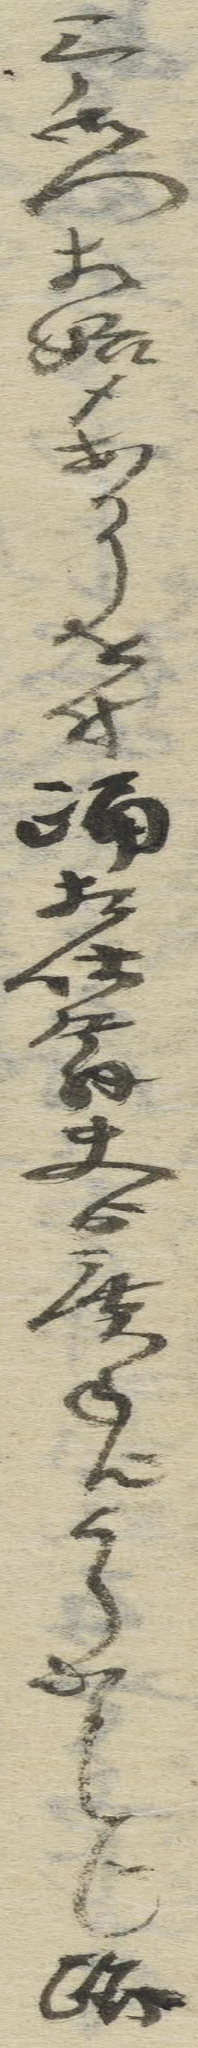三ノ御門相始メあかりを付踊相仕舞夫ゟ廣手江くり出し申候後
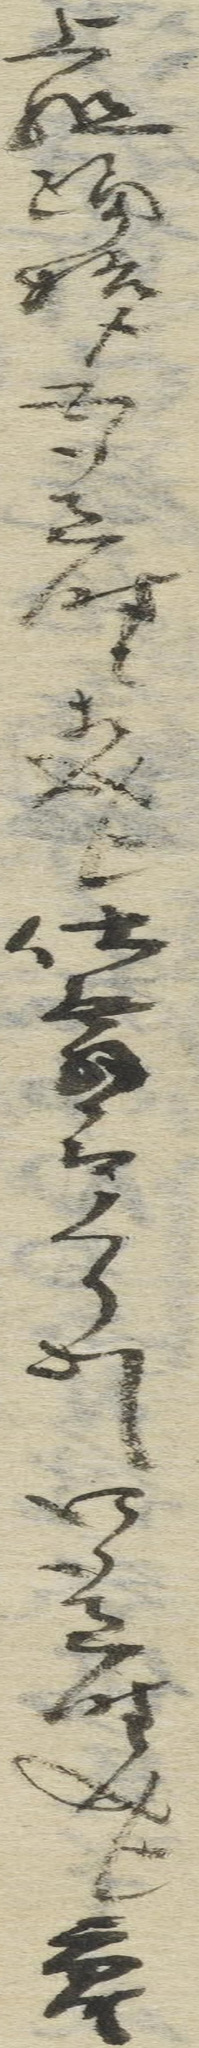上組踊始メ五ッ過時に相成申候仕舞江くり出し四ッ過時二成申候市町
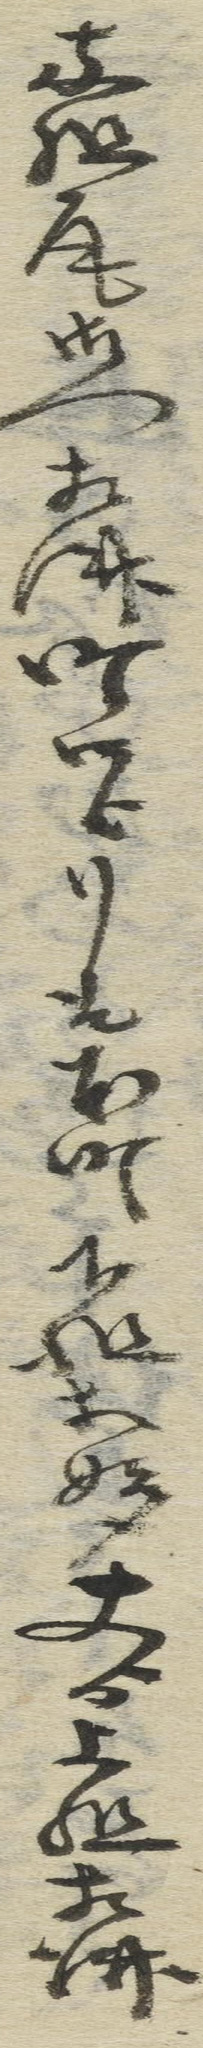両組瓦御門相済町口江引取本町下組相始メ夫ゟ上組相済
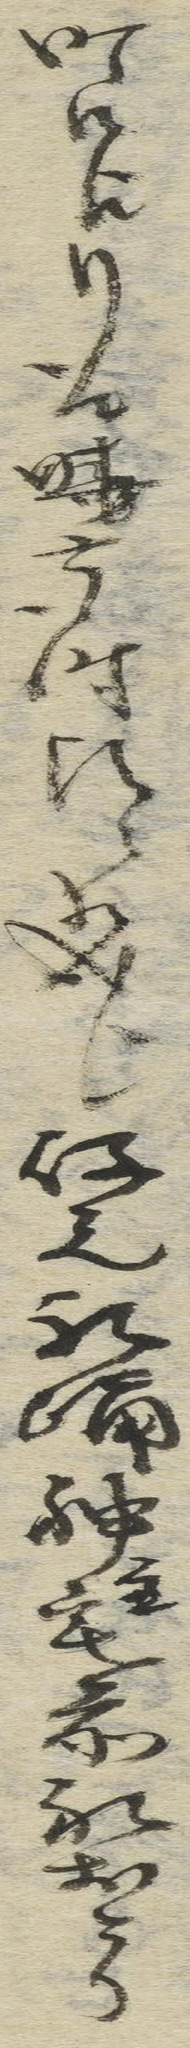町口江引取暁六ッ時頃二相成申候役元礼踊神主宅前礼おとり
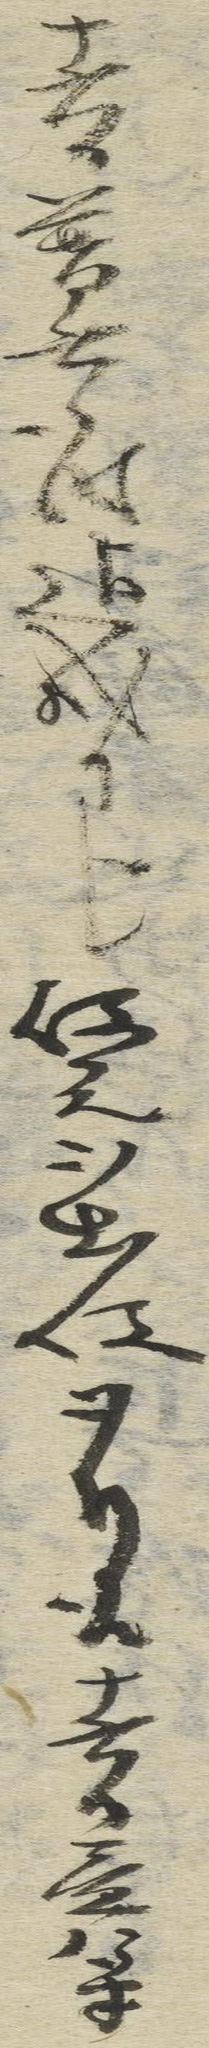十六日暮六ッ時迄成申候役元御出役御引取十六日昼八ッ半
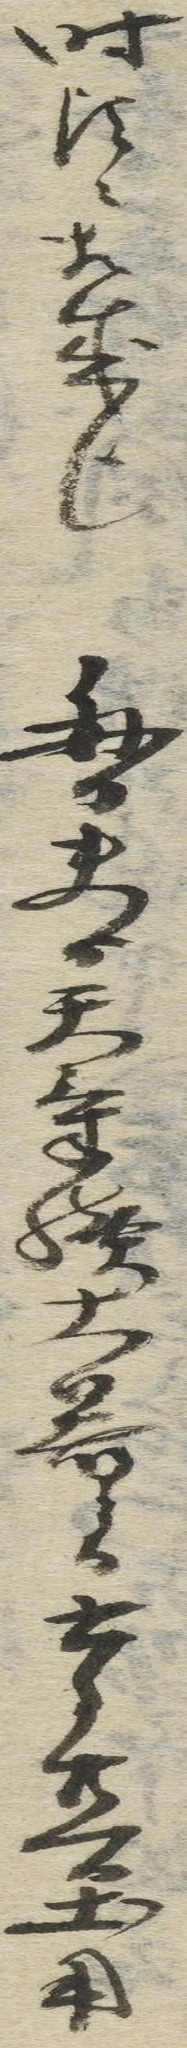時頃二相成申候此日夫ゟ天気続大暑二而六月廿一日土用
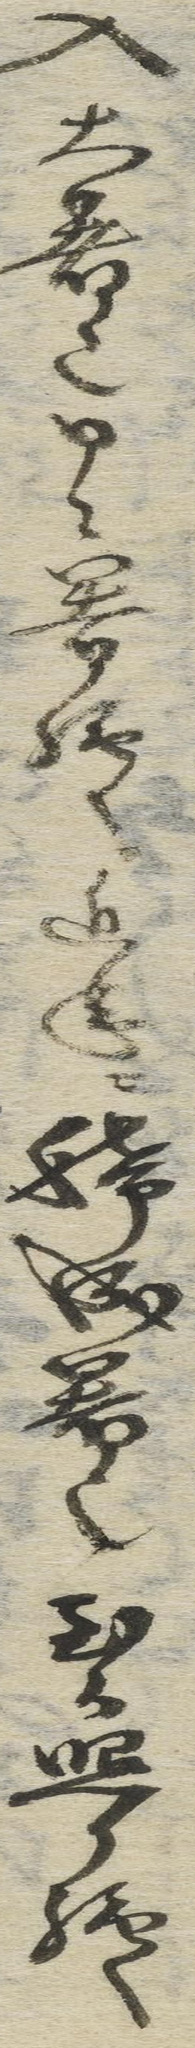入大暑也日々暑強く近年二稀成暑く至而照り強く
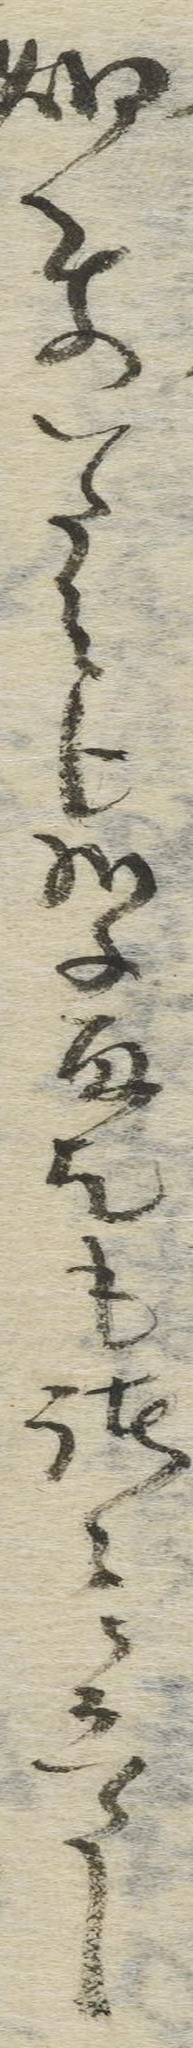畑ものいたミ申候様子雨乞も諸〻二而いたし
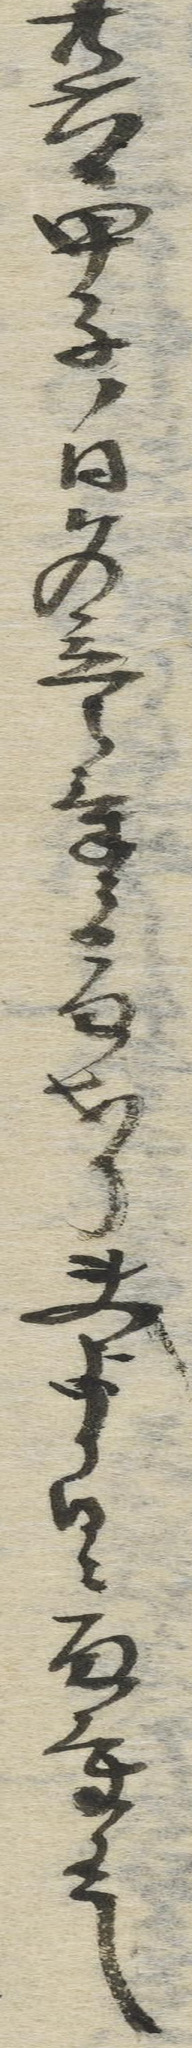廿六日甲子ノ日夕立気二而雨あり夫より日々雨気有之
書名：信濃越後　地震書留
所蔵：東京大学地震研究所図書室 Earthquake Research Institute Library, The University of Tokyo, JAPAN
